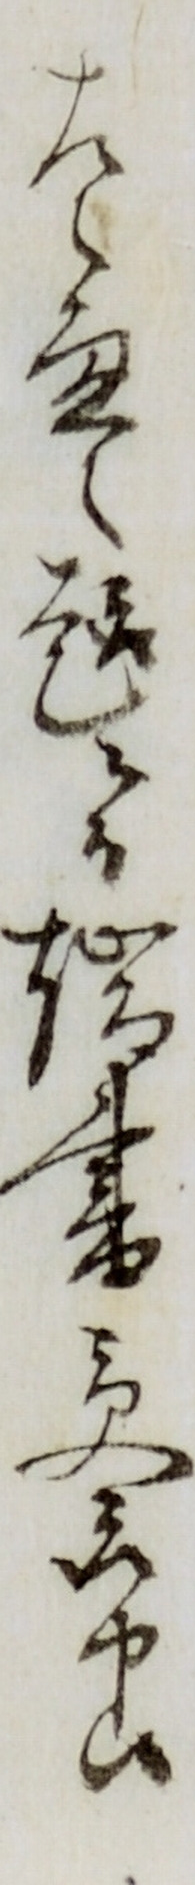左之通之趣にて端書受取申候
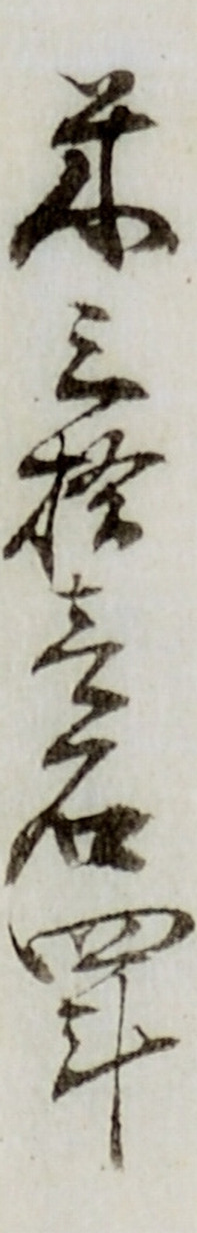米三拾壱石四斗
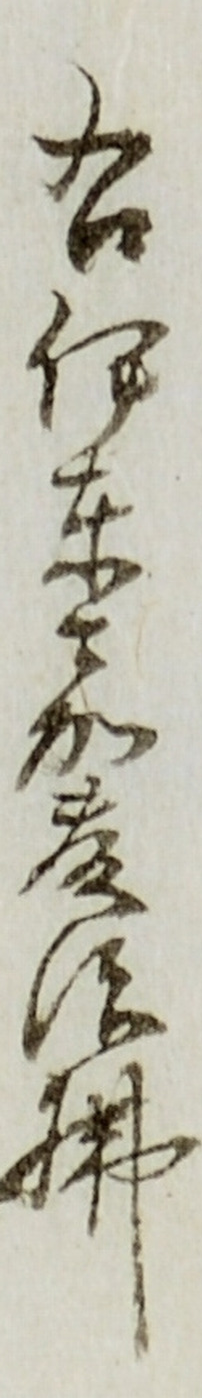右伊東嘉藤治払
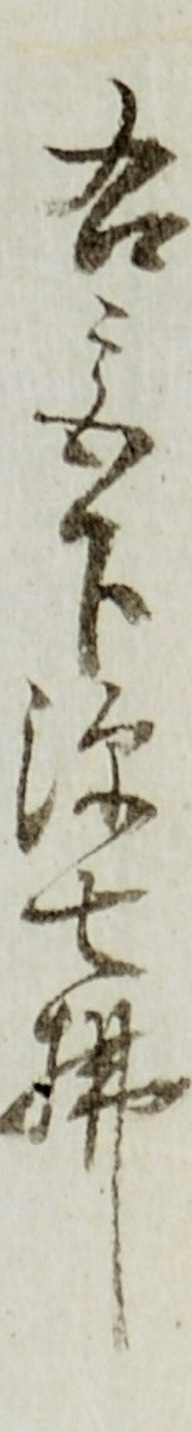右宮下源七払
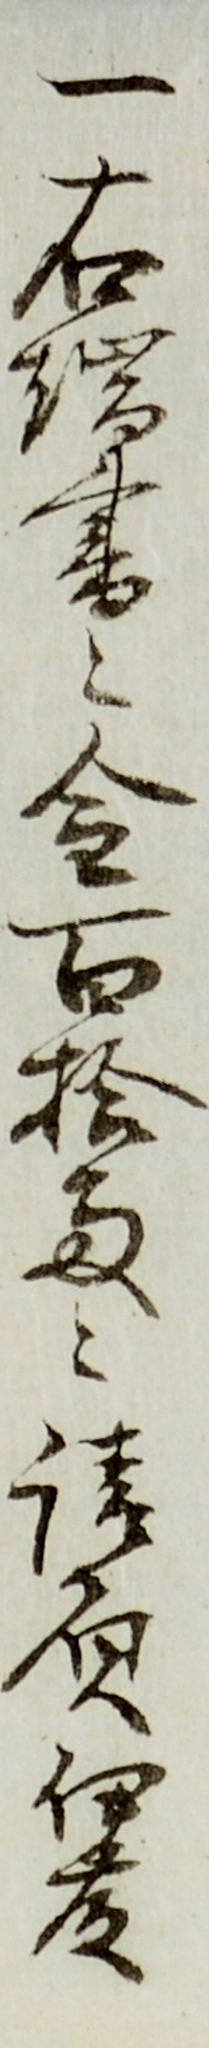一右端書之金百拾両之請負伊藤
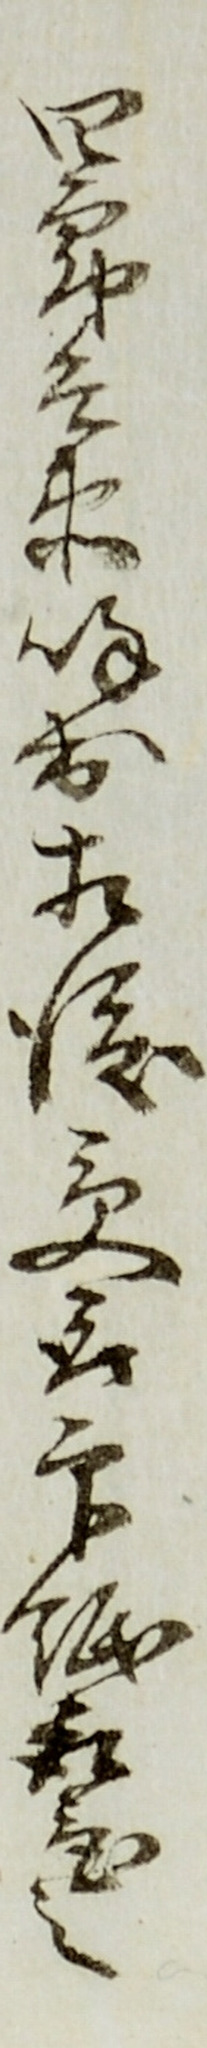四郎兵衛呼出相渡受取印紙取置之
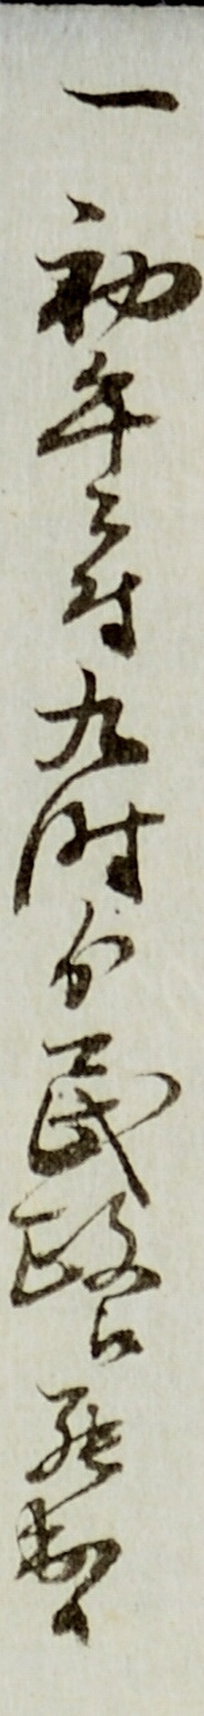一初午に付九時ゟ民政え罷出候
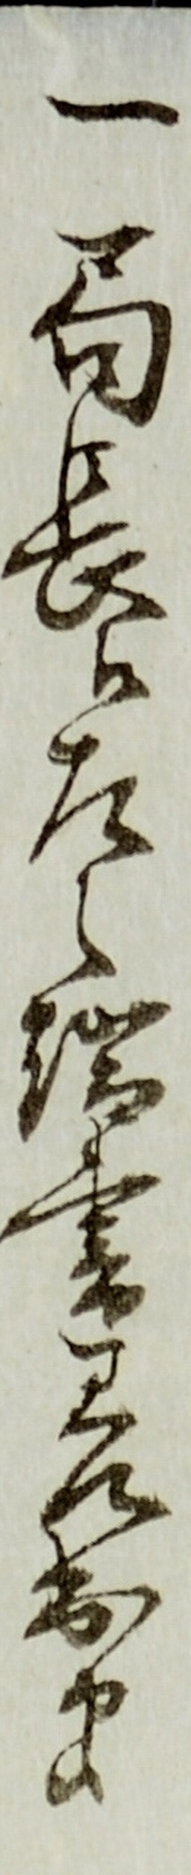一局長え左之端書差出申候
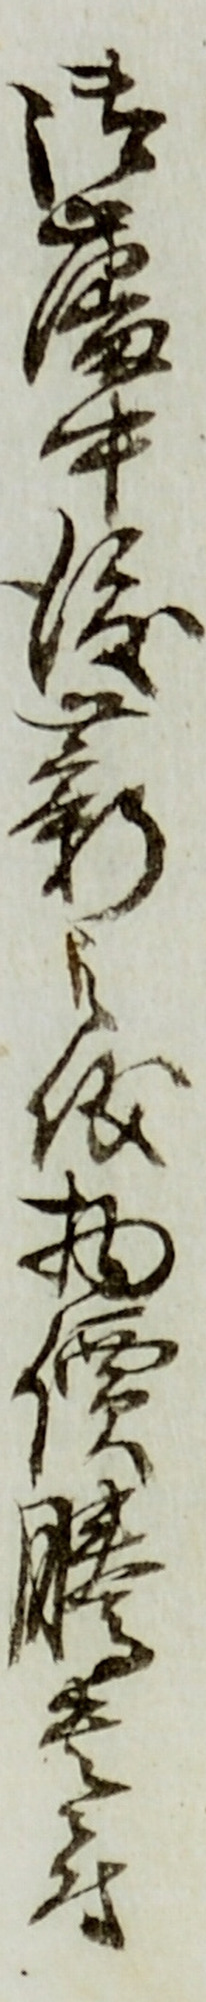御藩中渡薪之儀物価騰貴に付
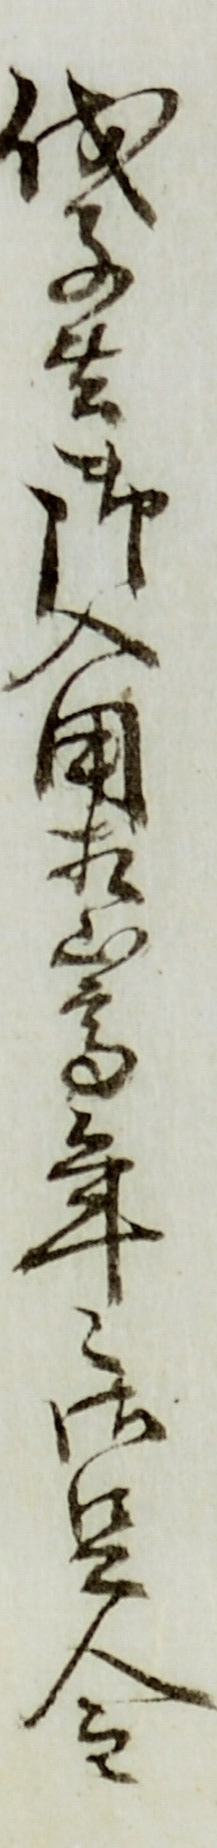伐子共御入用相嵩年々御足金
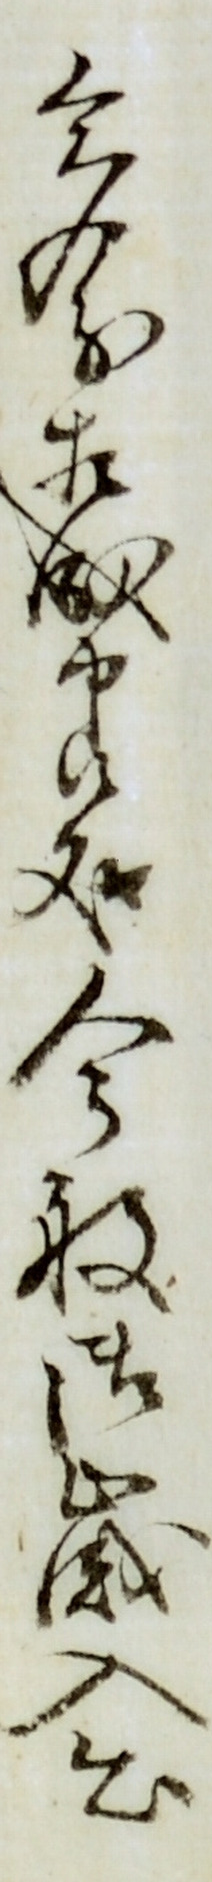多分相成申候処今般御歳入出

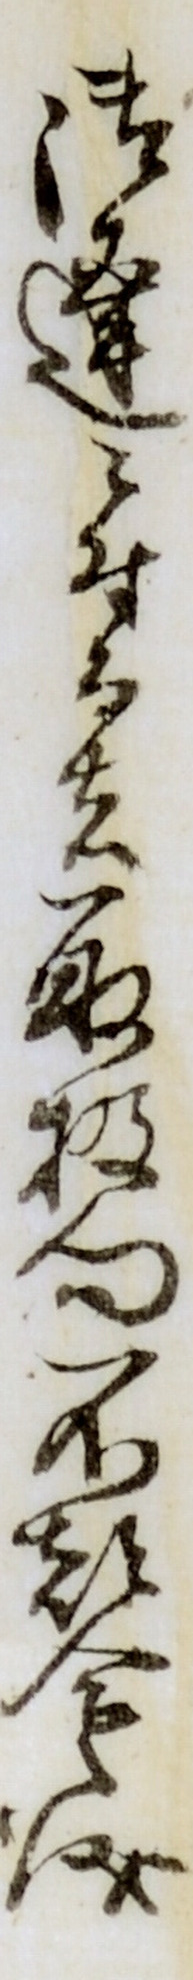御逢に付ては取扱向不都合之儀
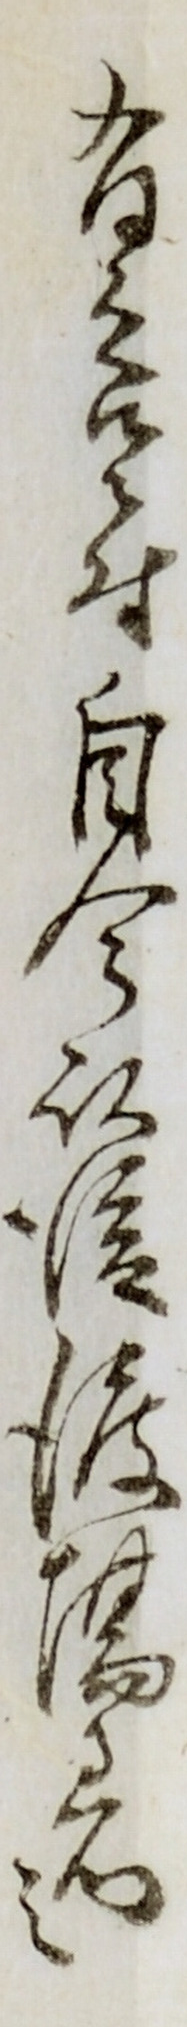有之候に付自今以後渡場着之
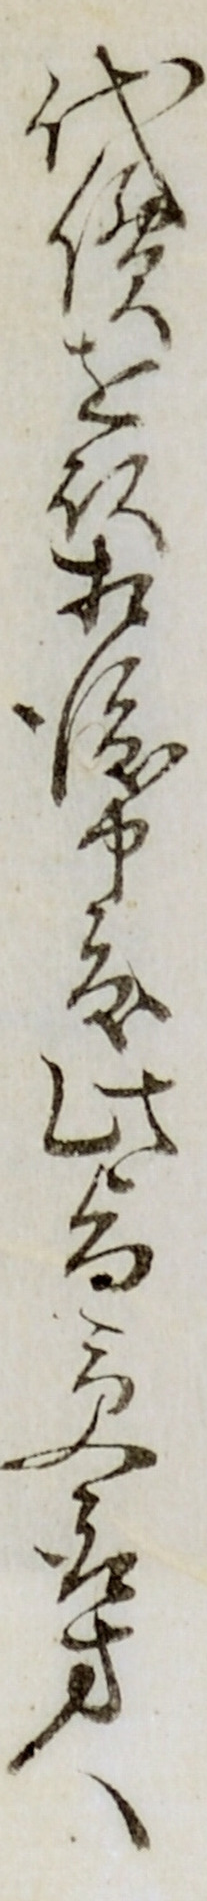代価を以相渡申度此旨受取方へ
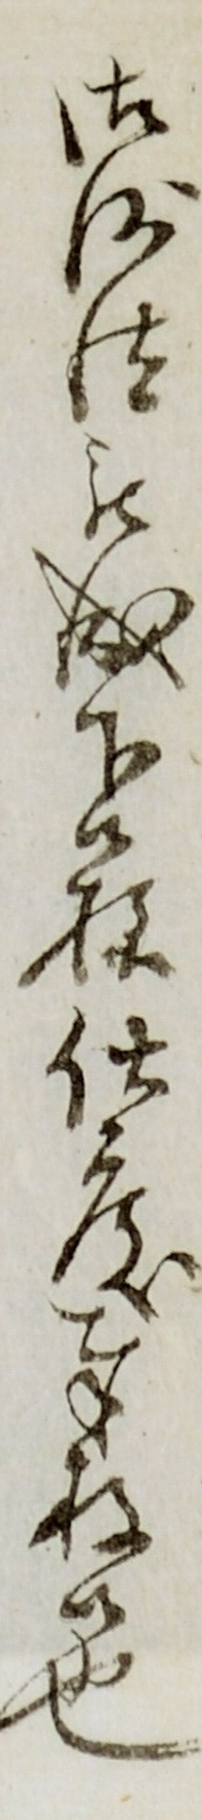御沙汰被成下候様仕度奉存候也
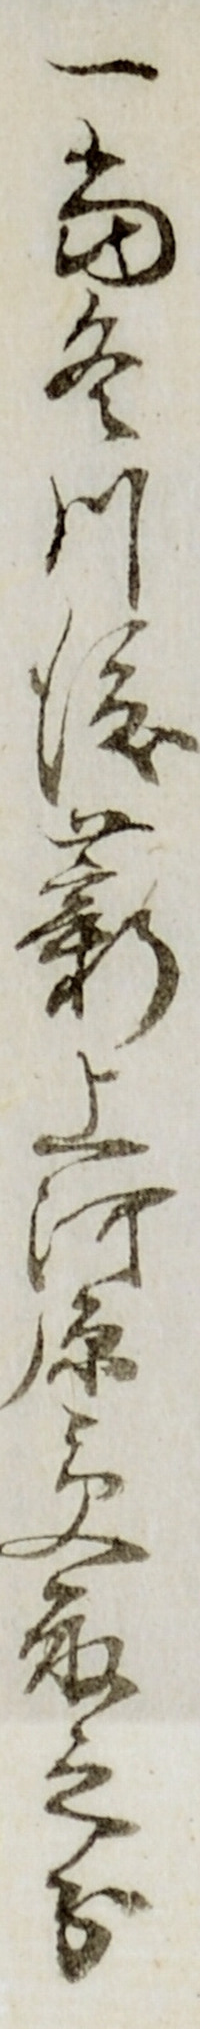一当冬川渡薪上河原受取之分
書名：山林方諸事御用留
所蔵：伊那市立高遠町図書館・合同会社AMANE
